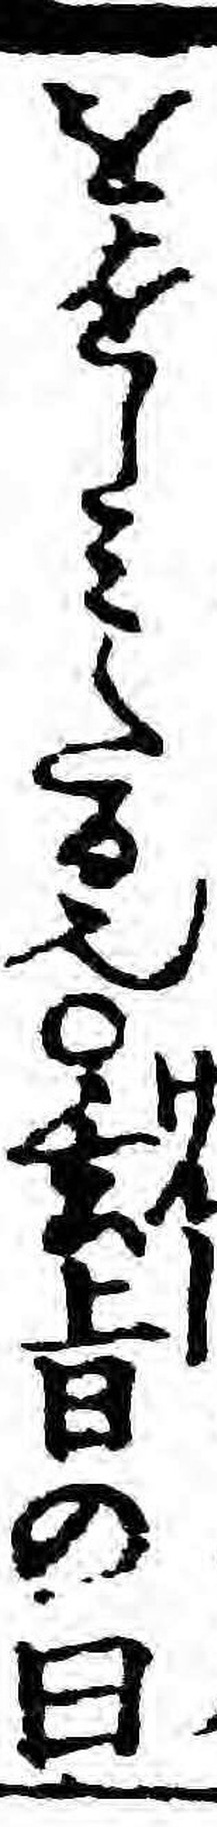ををしみたる也〇玄旨の曰
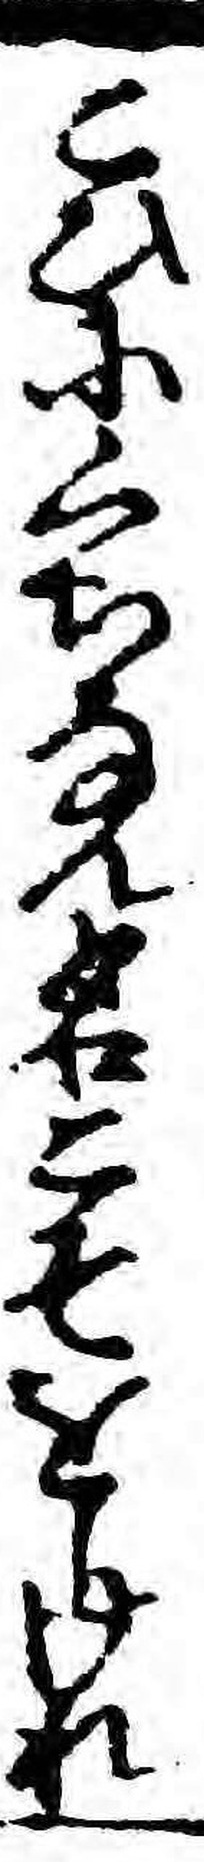こひにくちなん名こそをしけれ
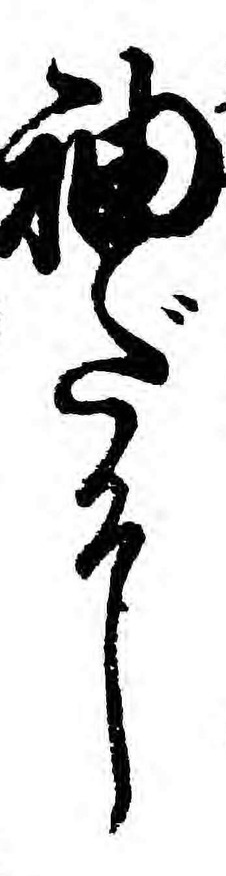袖だに
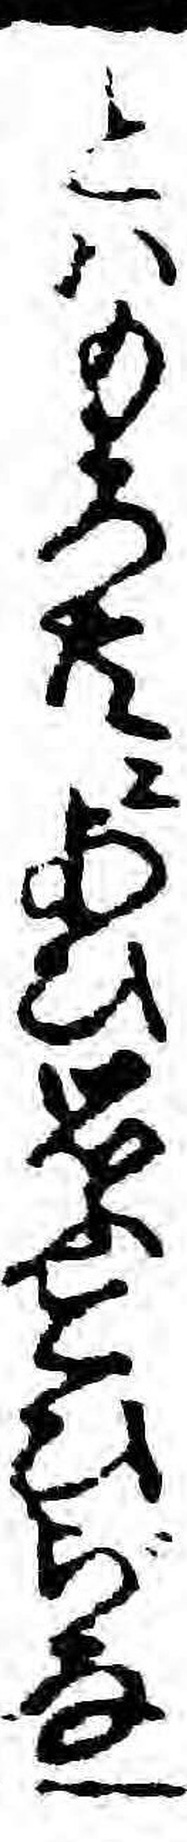とはもろ共にあひ思ふこひぢな
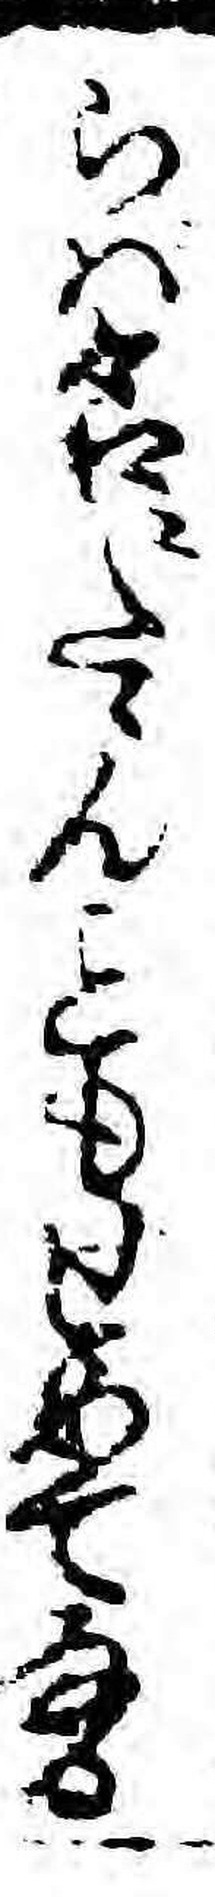らば名にたゝんこともせめてなる
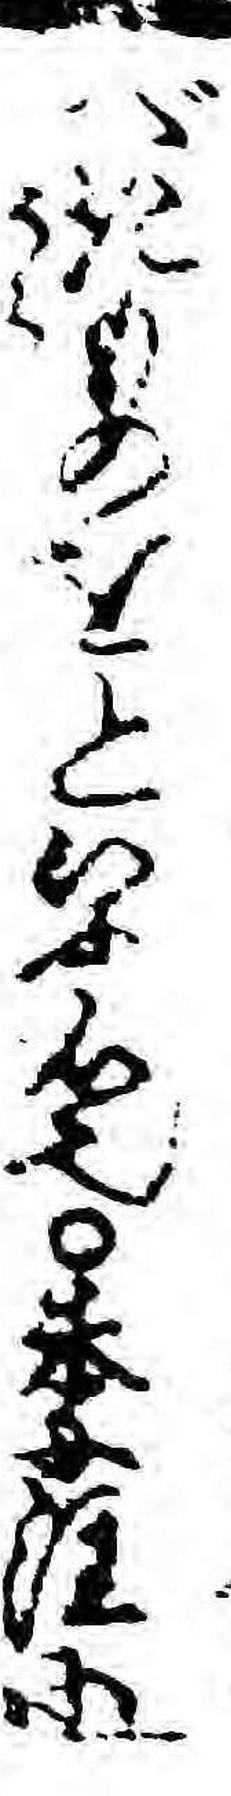べきものをといふ心也〇季注に
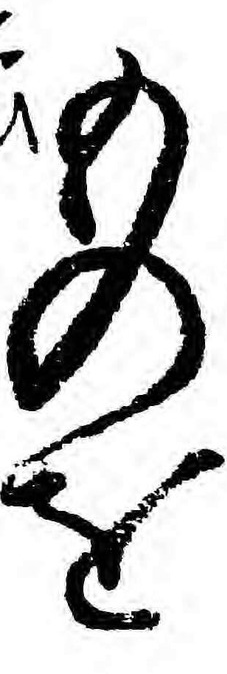ものを
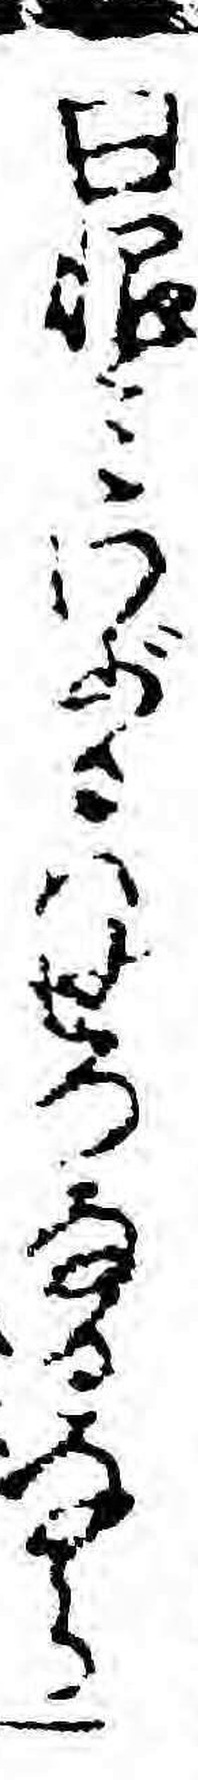曰恨みわぶるはせつなるなら
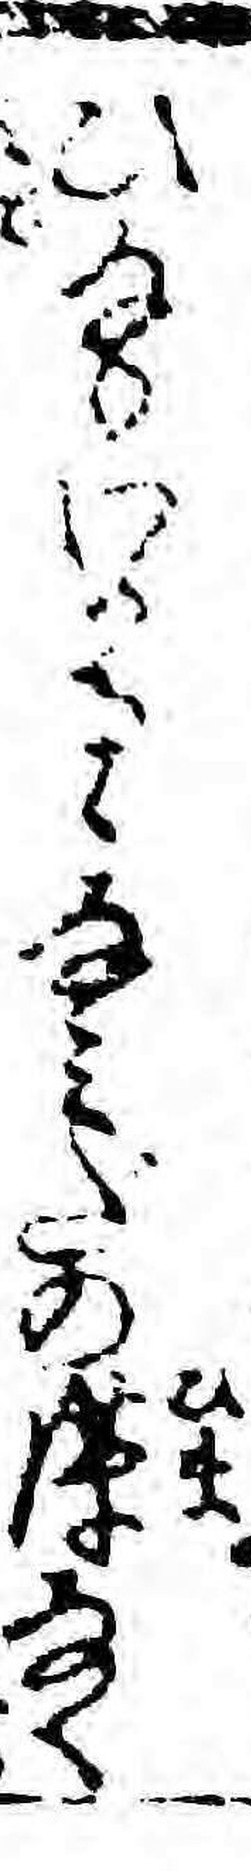ひなりわかるゝなみだの隙なく
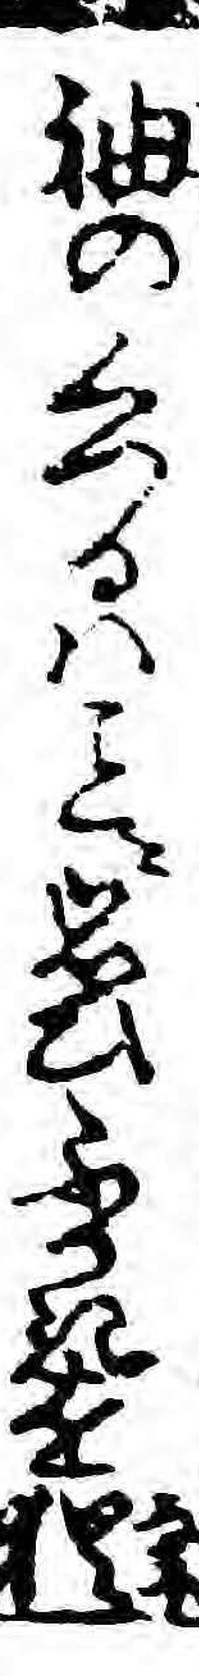袖のくつるはことに思ひふかきを猶
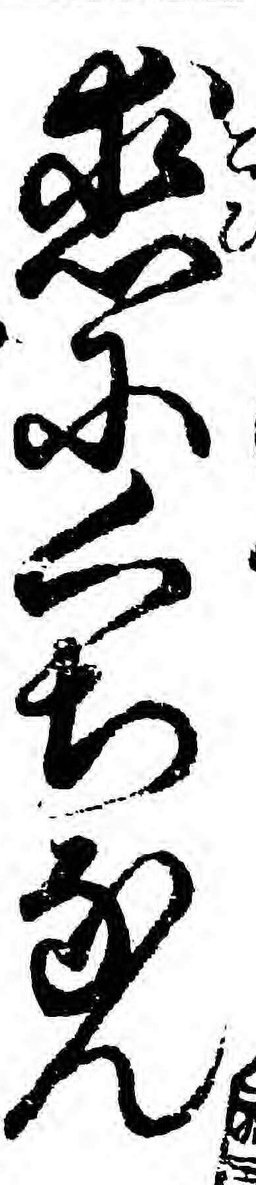恋にくちなん
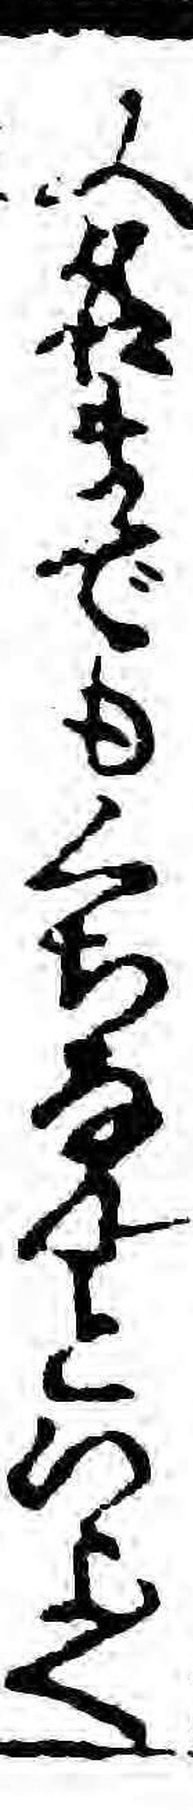又名までもくちなんこといよ〳〵
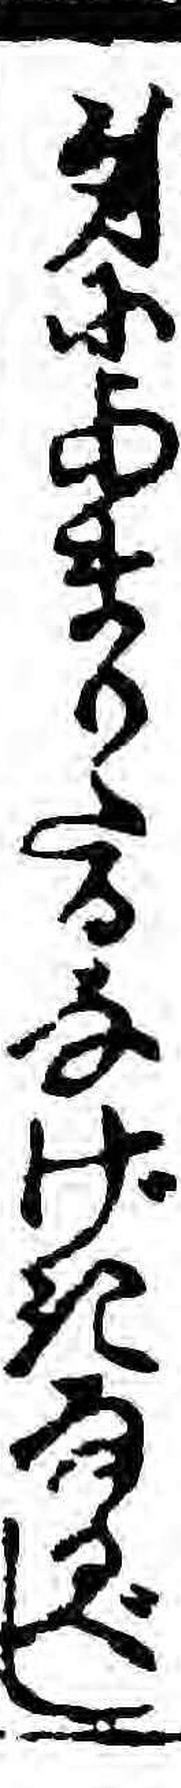身にあまりたるなげきなるべし
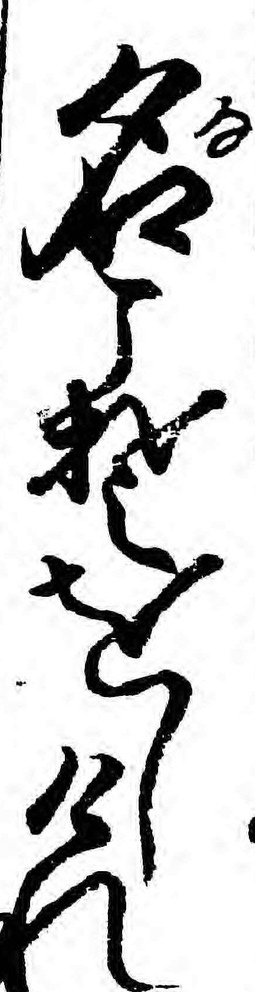名こそおしけれ

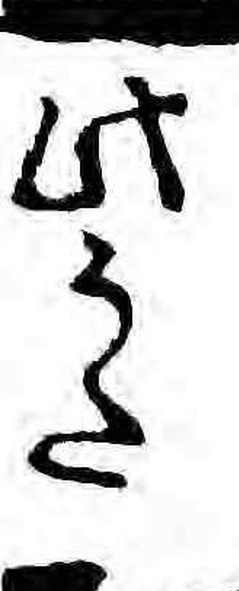此うた
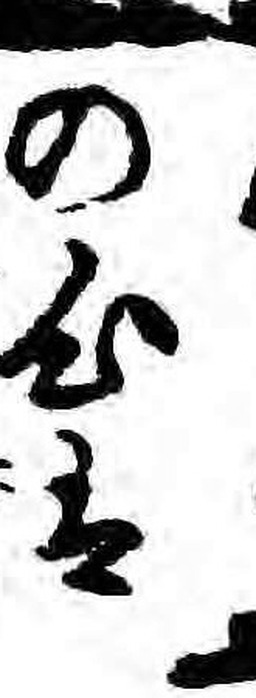の心は
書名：頭書和歌注譯／壽賀多百人一首小倉錦
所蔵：国文学研究資料館
